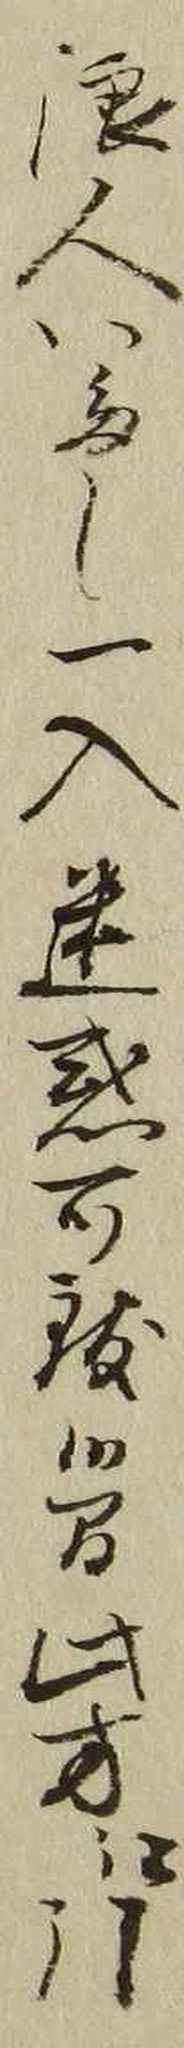浪人いたし一入迷惑可致候間此方江引
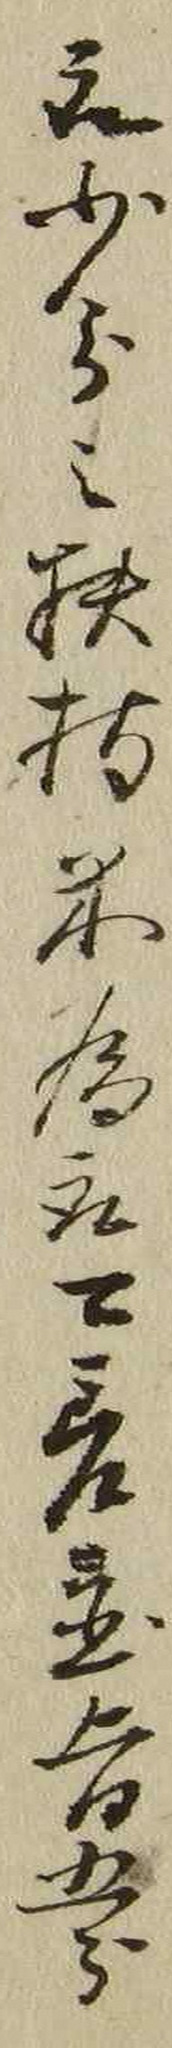取少分之扶持米為取可差置旨五郎
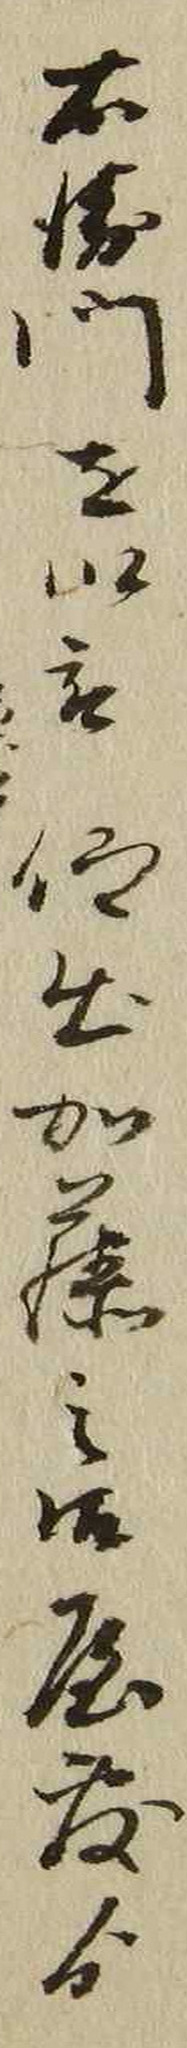右衛門を以被仰出加藤之御屋敷ゟ
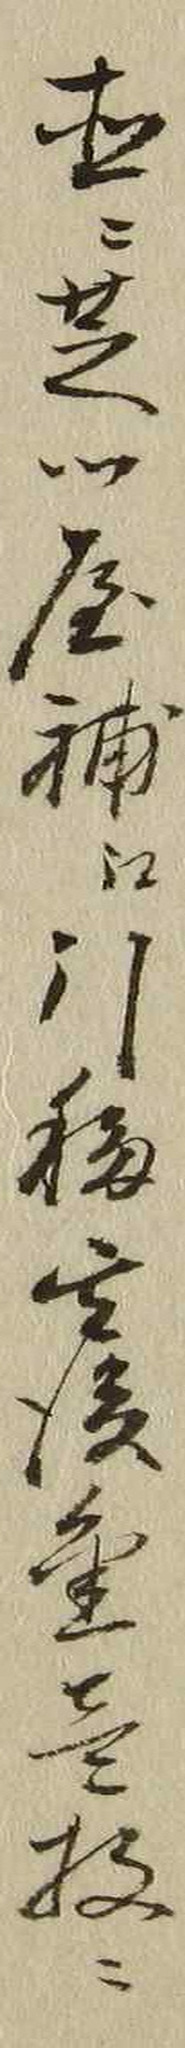直ニ芝御屋補江引移其後金壱枚ニ
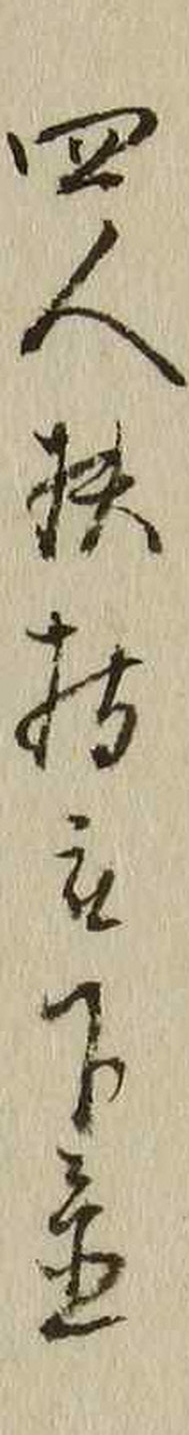四人扶持被下置
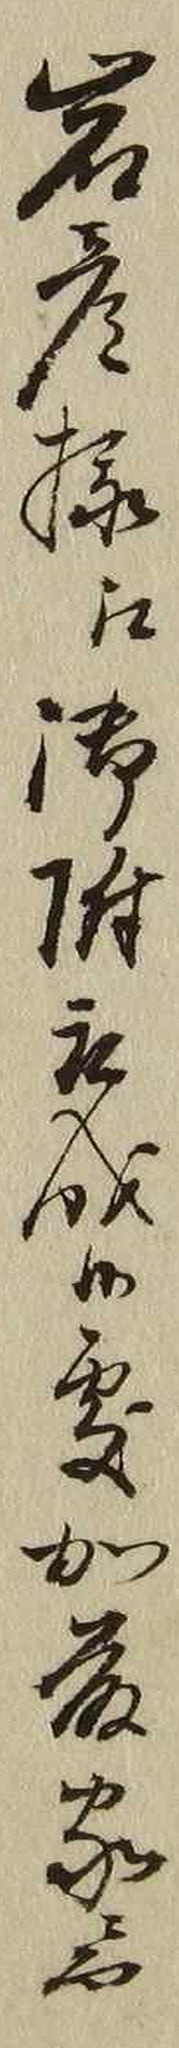岩彦様江御附被成候処加藤家ニ而
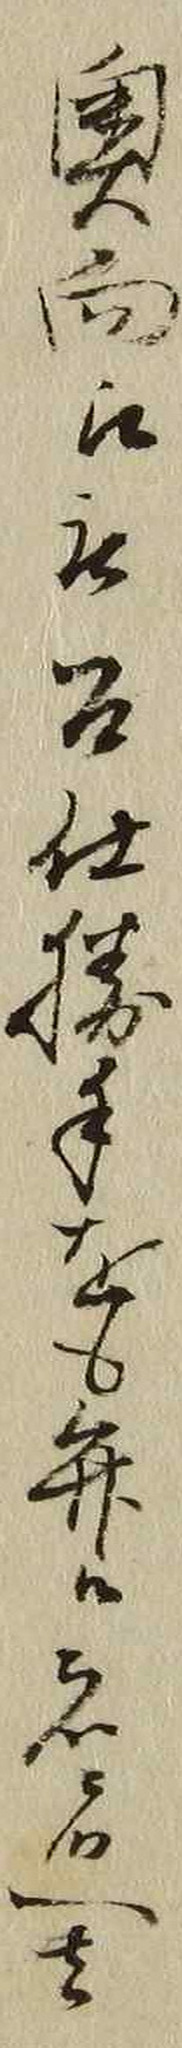奥向江被召仕勝手をも弁候者ニ候へ者
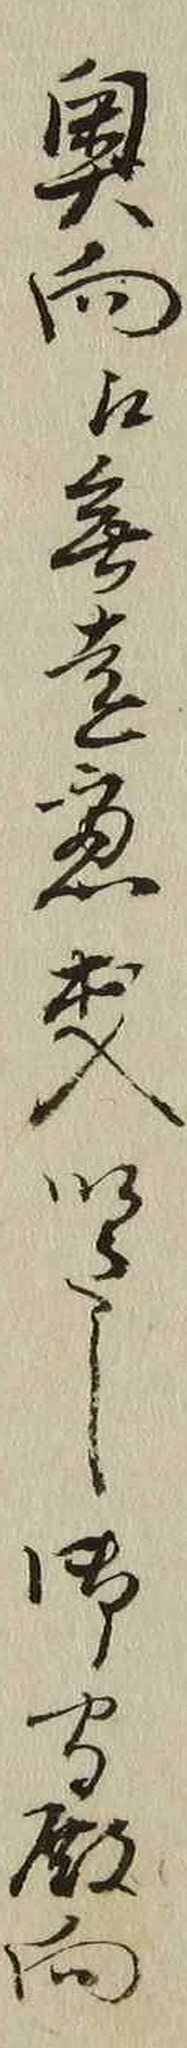奥向江無遠慮出人いたし御守殿向
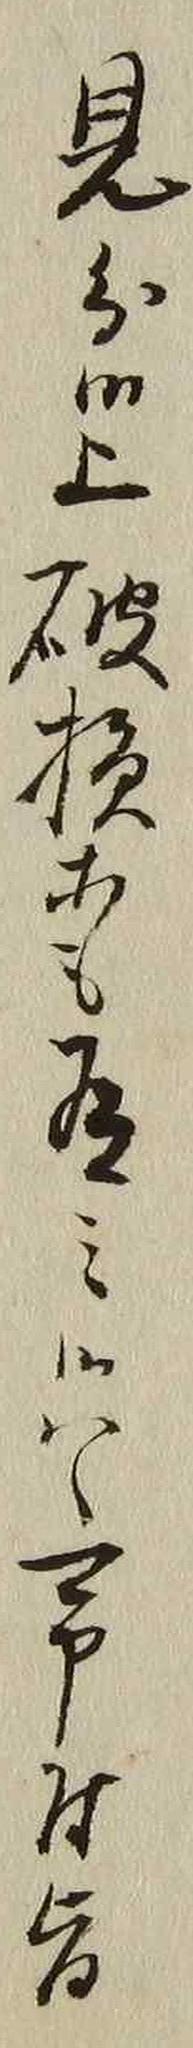見分候上破損等も有之候ハヽ可申付旨
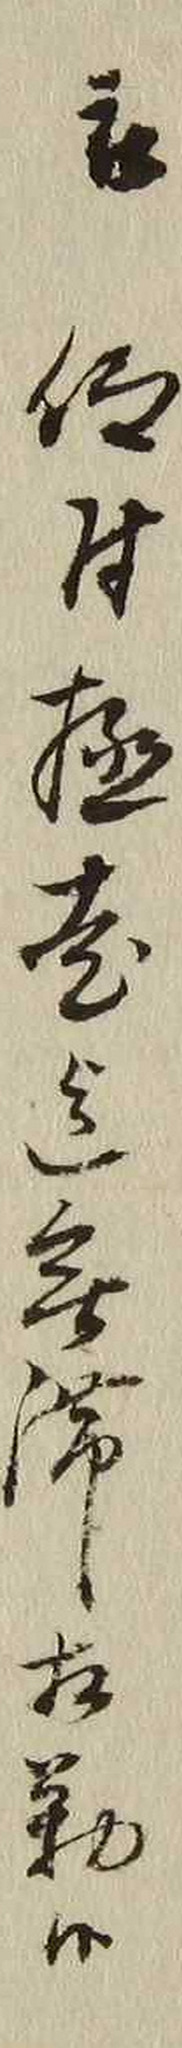被仰付極老迄無滞相勤候
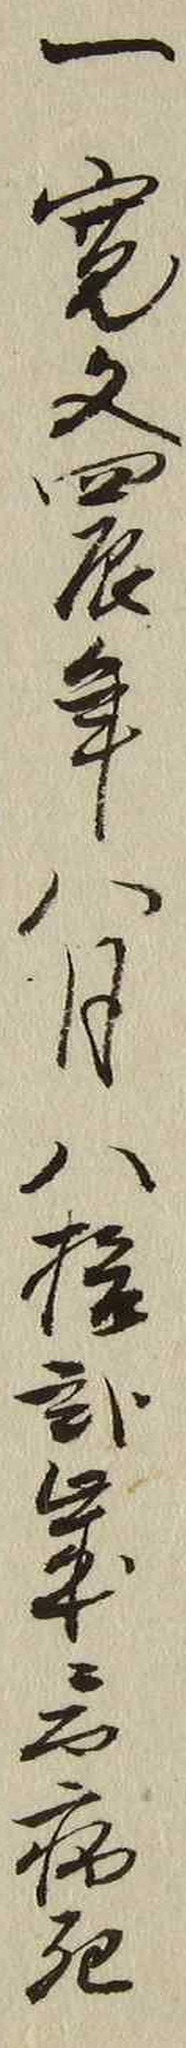一寛文四辰年八月八拾弐歳ニ而病死
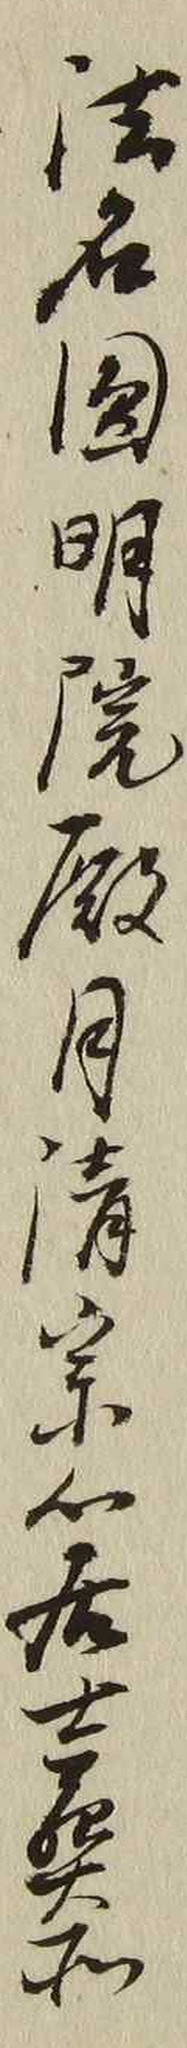法名円明院殿月清宗心居士葬所
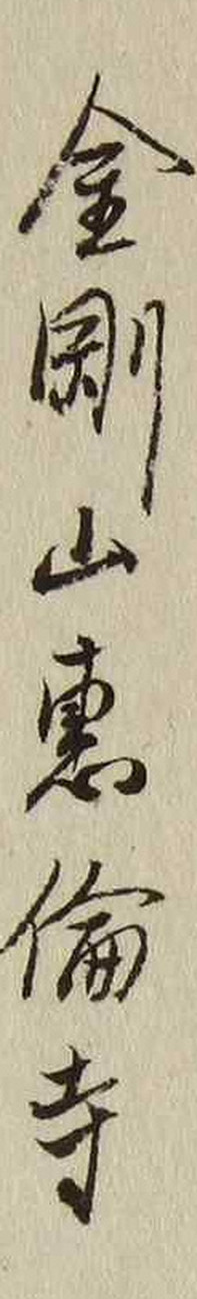金剛山恵倫寺
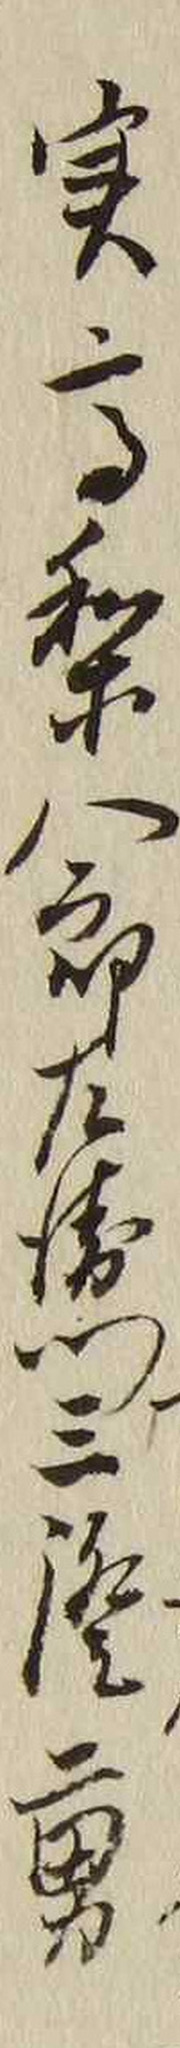実高梨八郎左衛門三澄二男

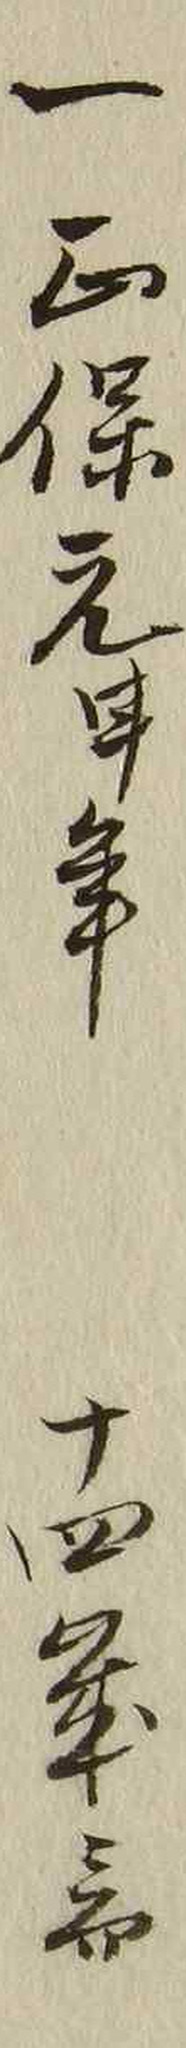一正保元申年十四歳ニ而
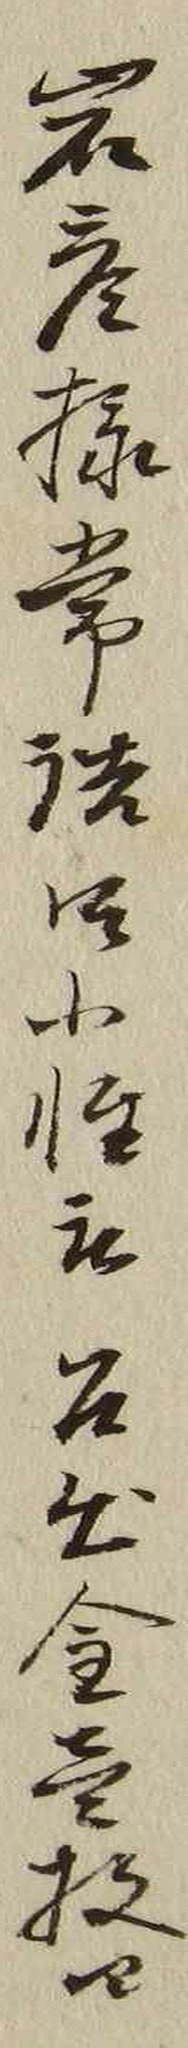岩彦様常詰御小性被召出金壱枚四
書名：諸士系譜　巻之359　す之部9
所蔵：会津若松市立会津図書館
